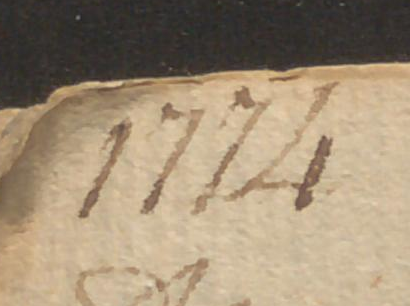1774
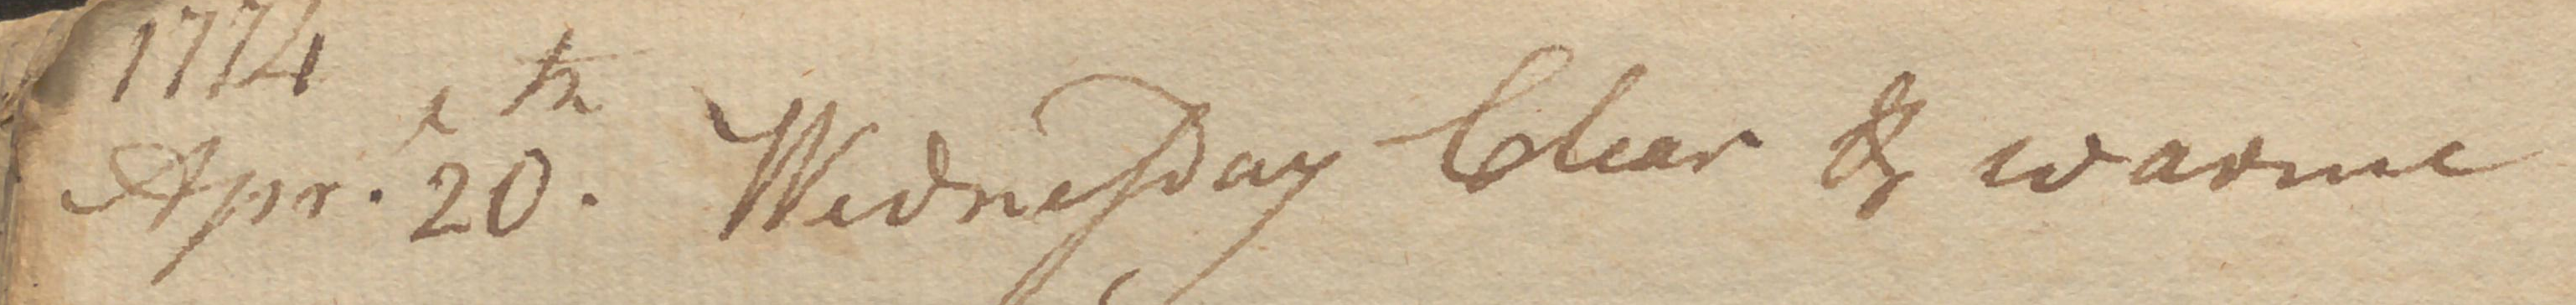Apr^l. 20h. Wednesday Clear & warme
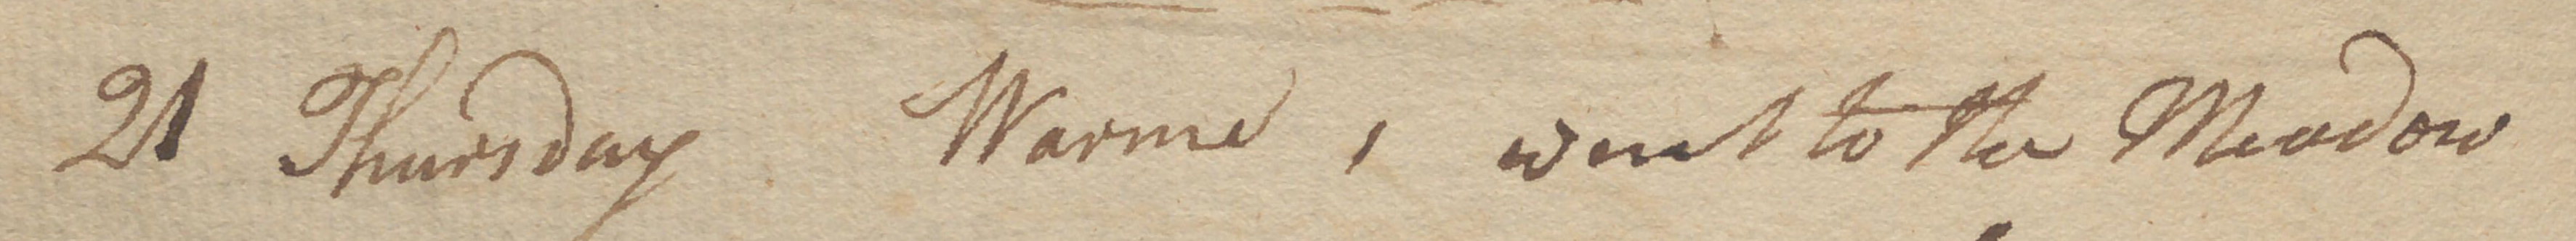21 Thursday Warme, went to the Meadow
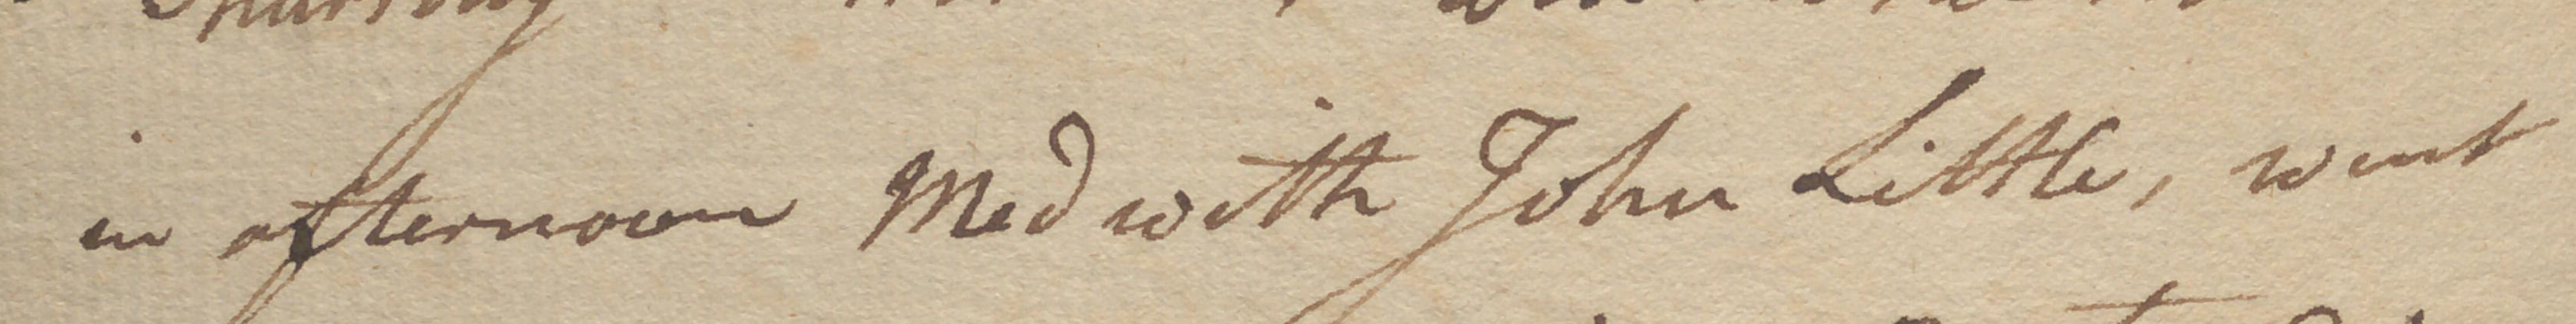in afternoon Med with John Little, went
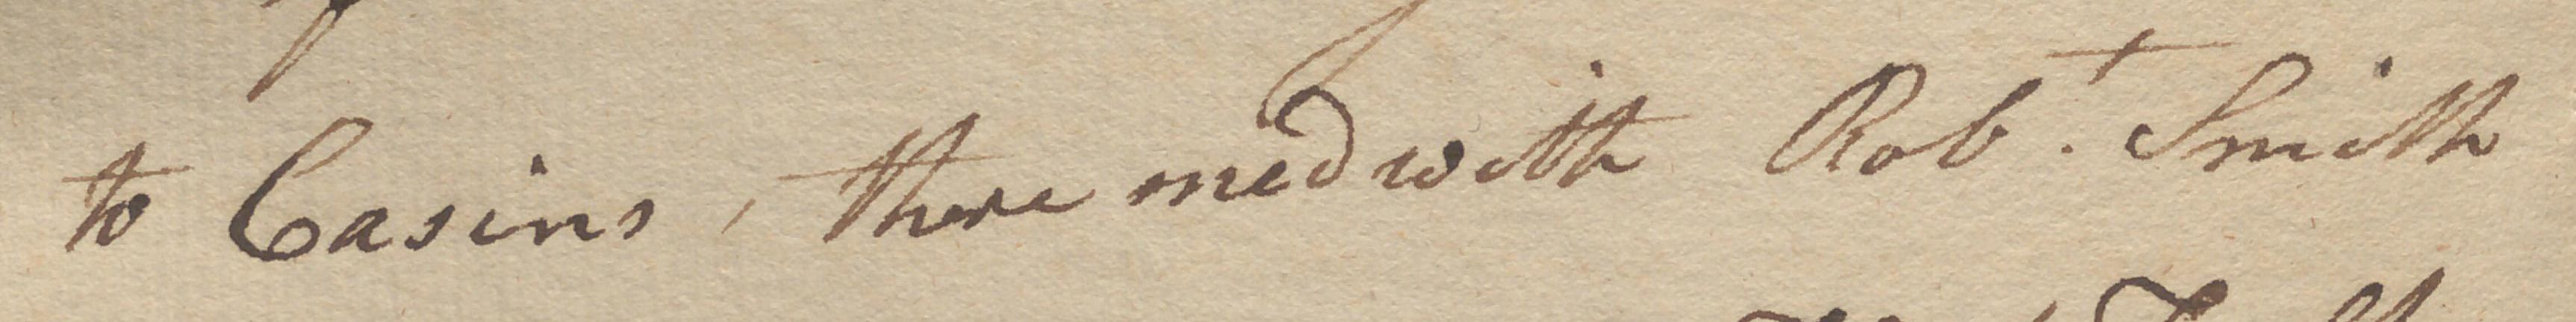to Casins, there med with Rob^t. Smith
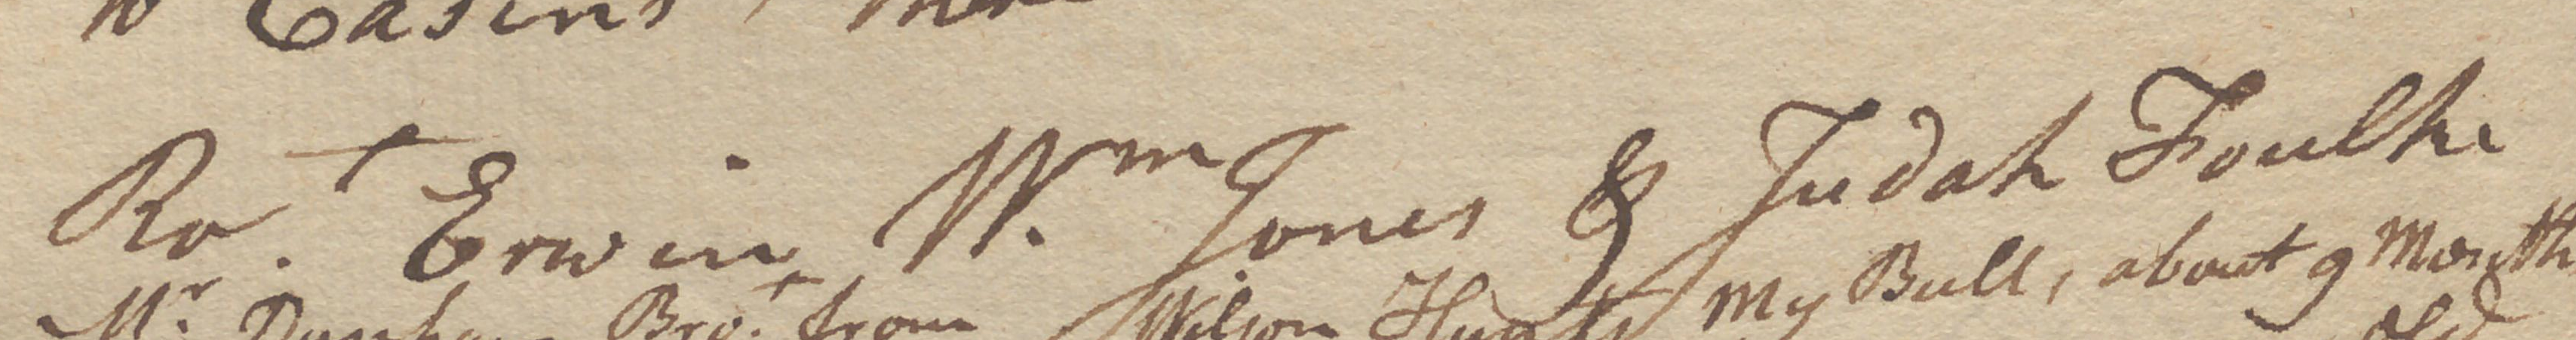Ro^t. Erwin W^m. Jones & Judah Foulke
